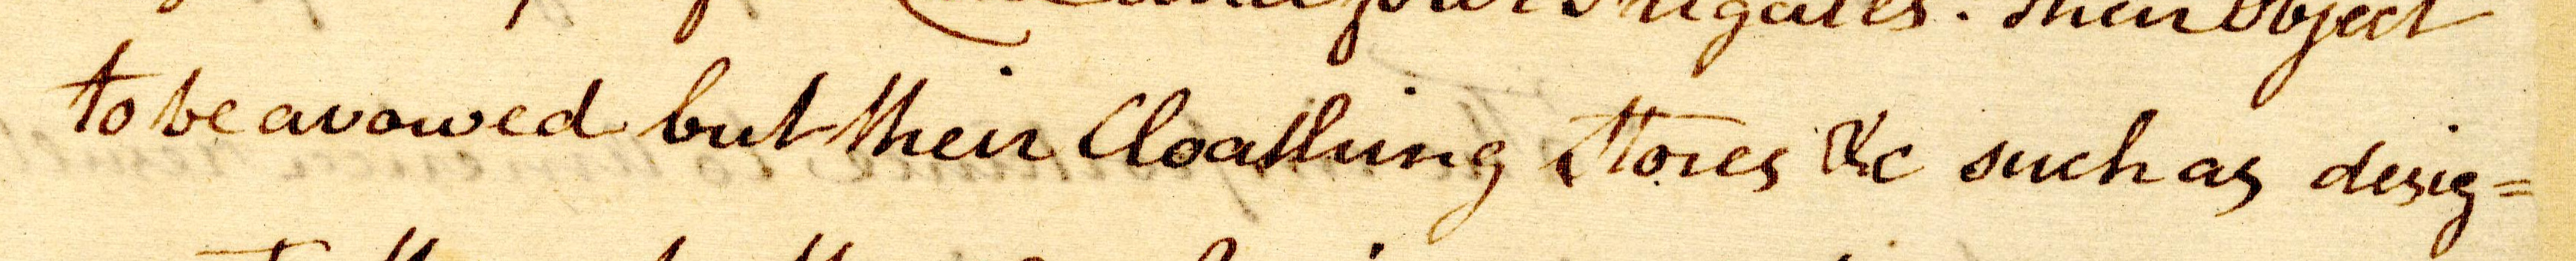to be avowed but their Cloathing Stores &c such as desig-
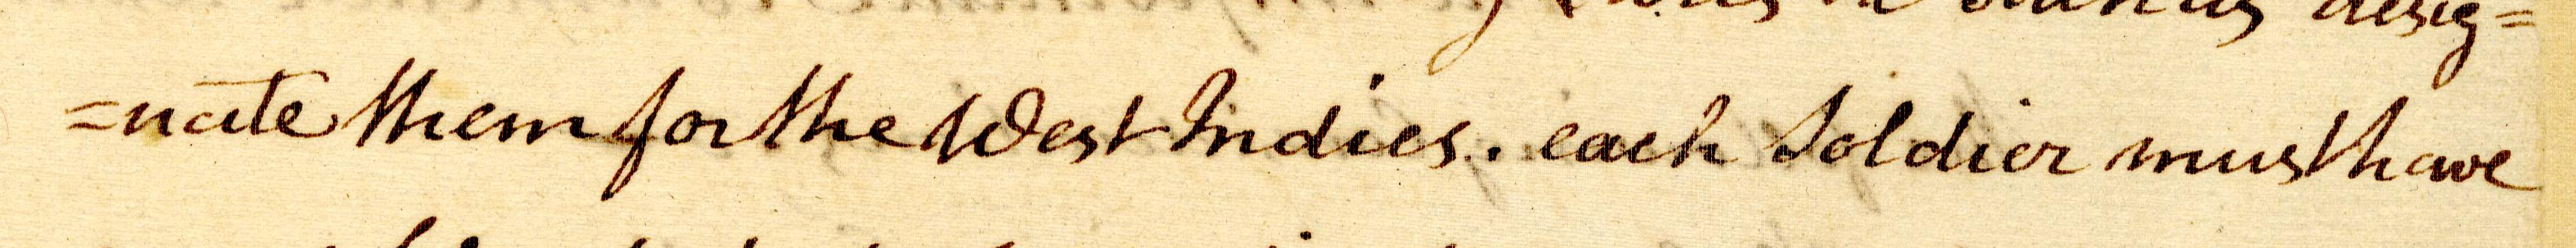-nate them for the West Indies. each Soldier must have
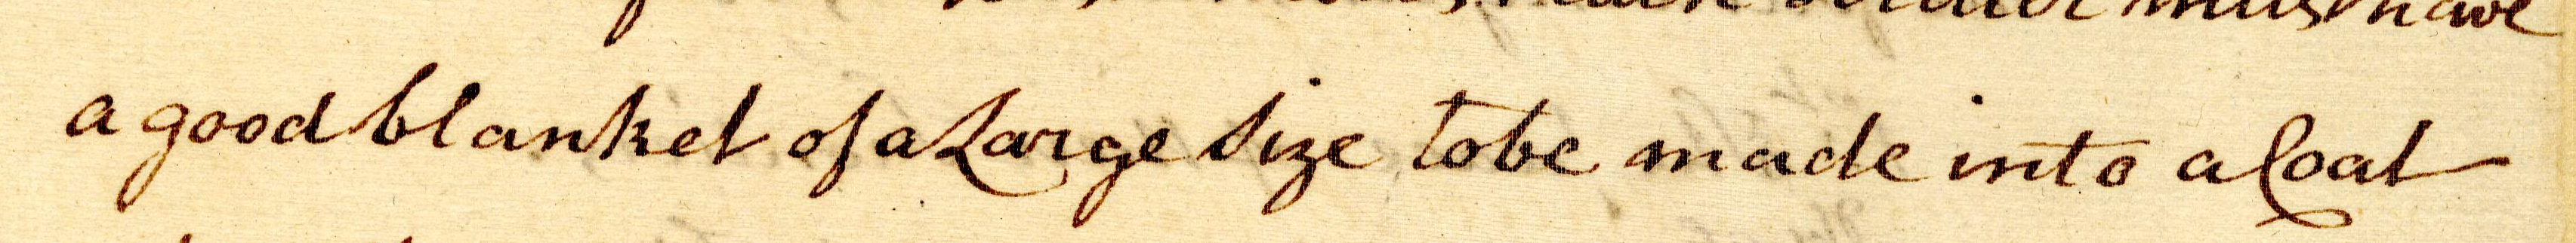a good blanket of a Large Size to be made into a Coat
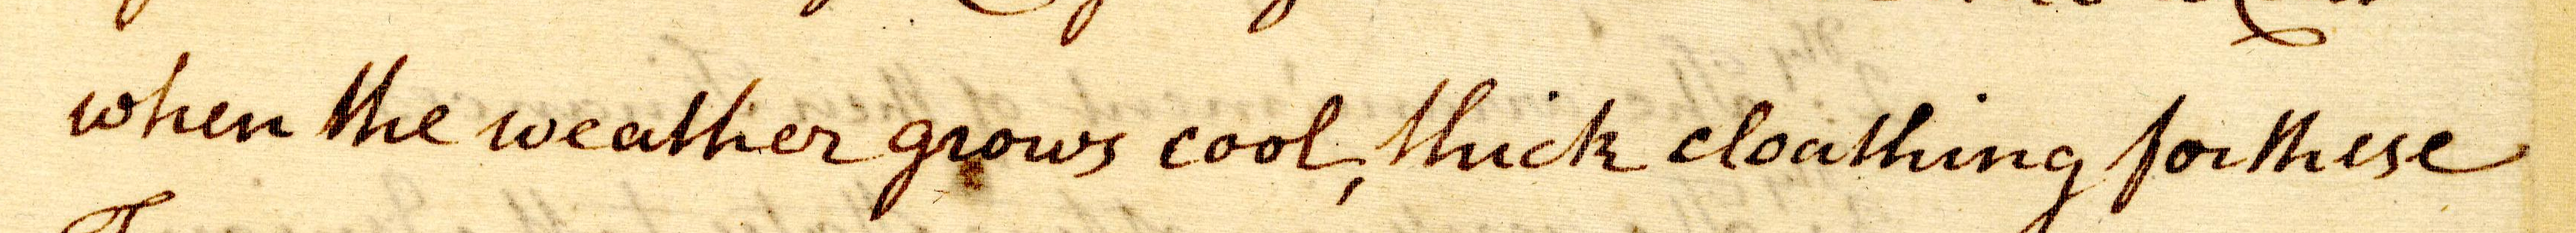when the weather grows cool, thick cloathing for these
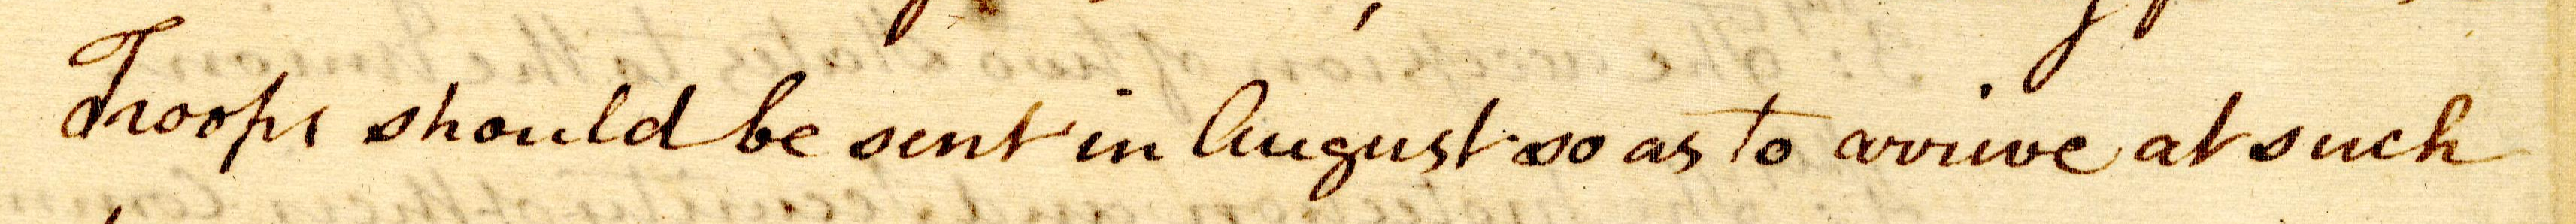Troops should be sent in August so as to arrive at such
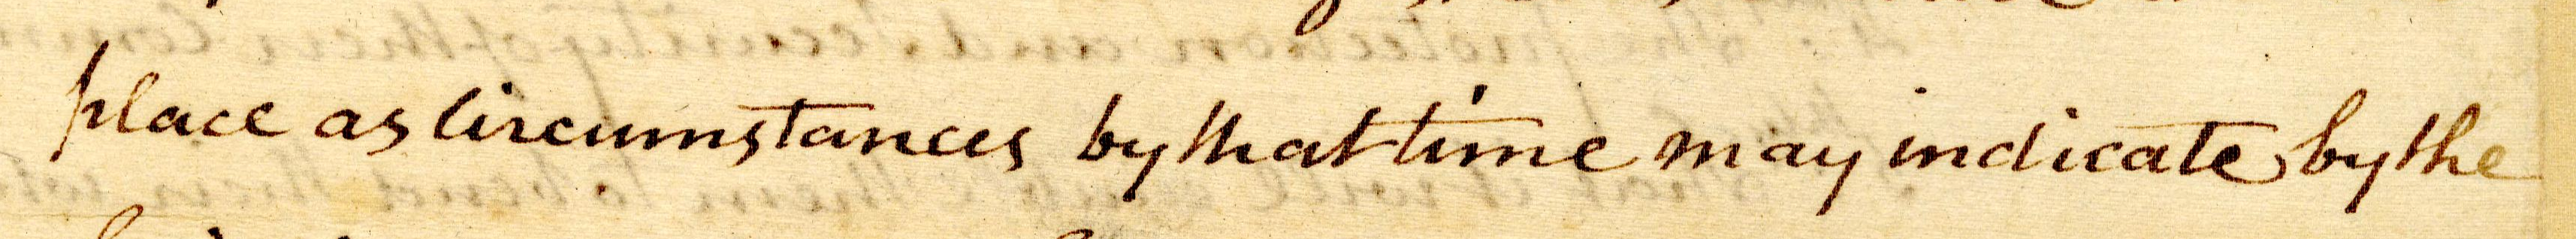place as Circumstances by that time may indicate by the
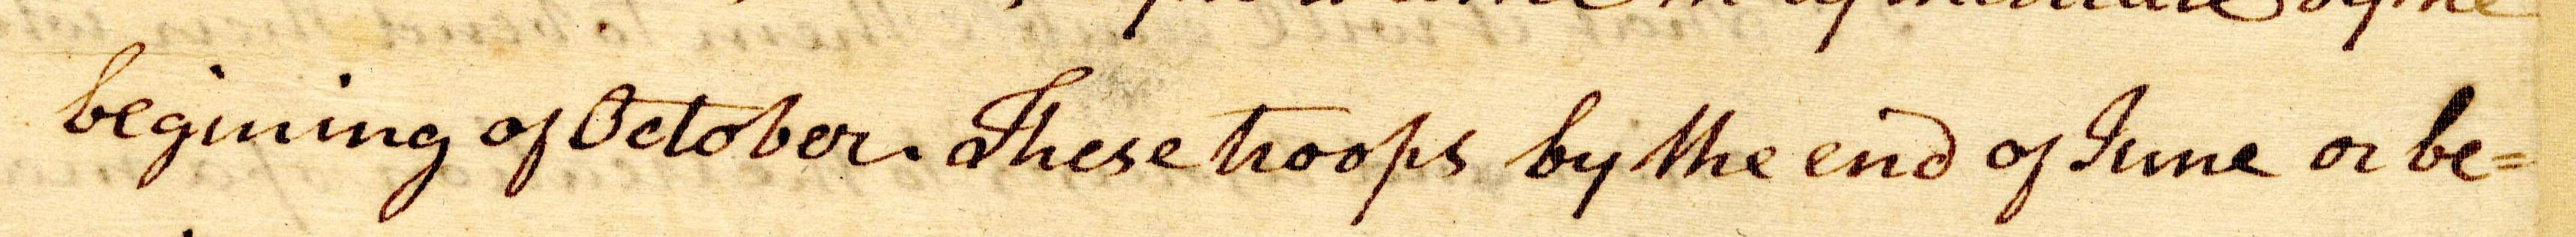begining of October. These troops by the end of June or be-
